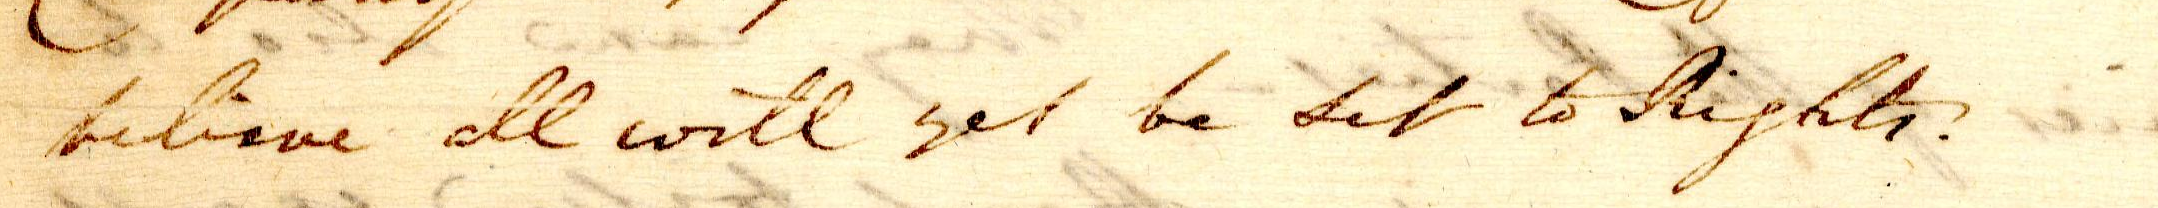believe all will yet be set to Rights.
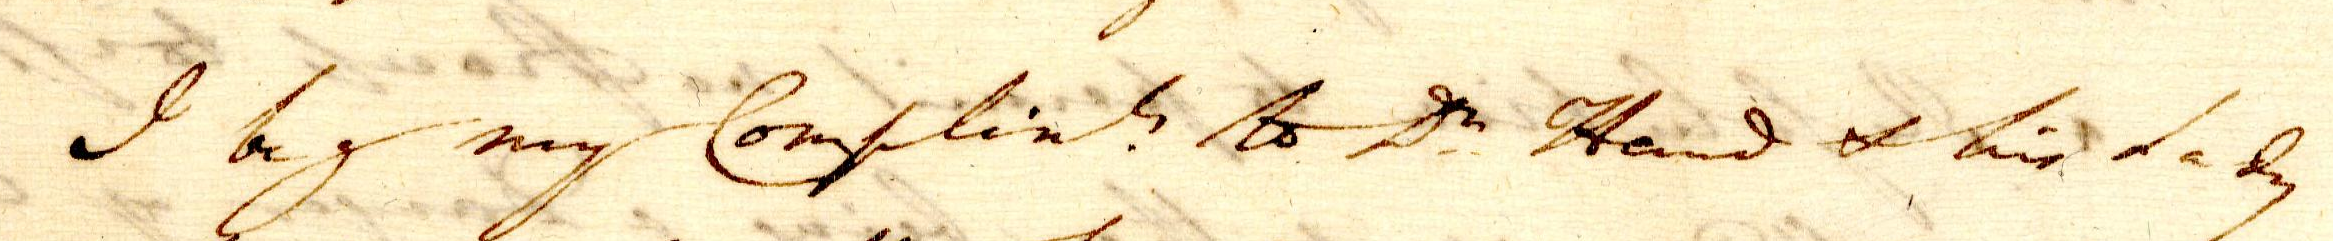I beg my Complin^ts to D^r. Hand & his Lady
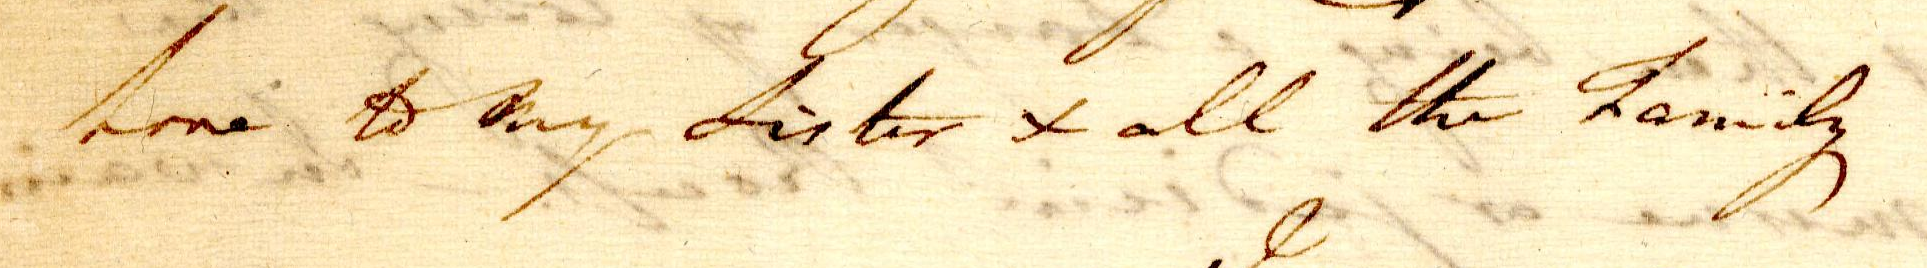Love to my Sister & all the Family
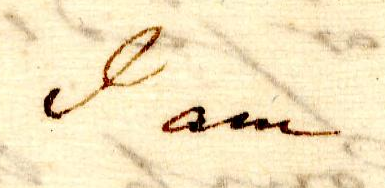I am
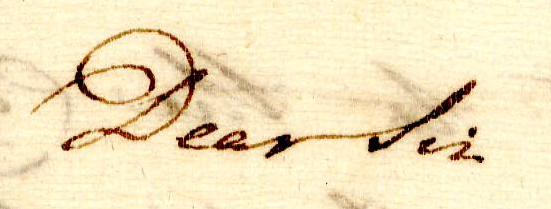Dear Sir
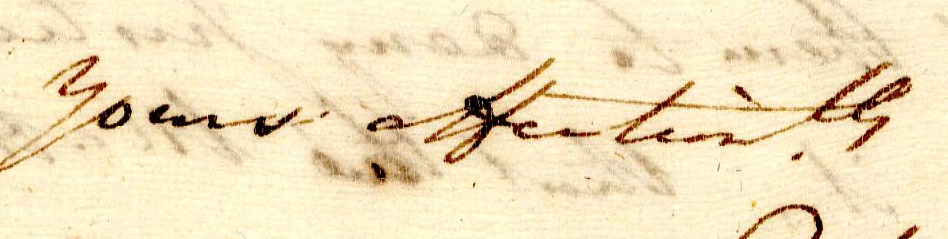Yours affection^ly
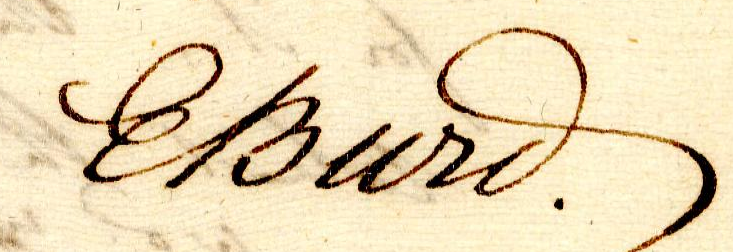E. Burd.
